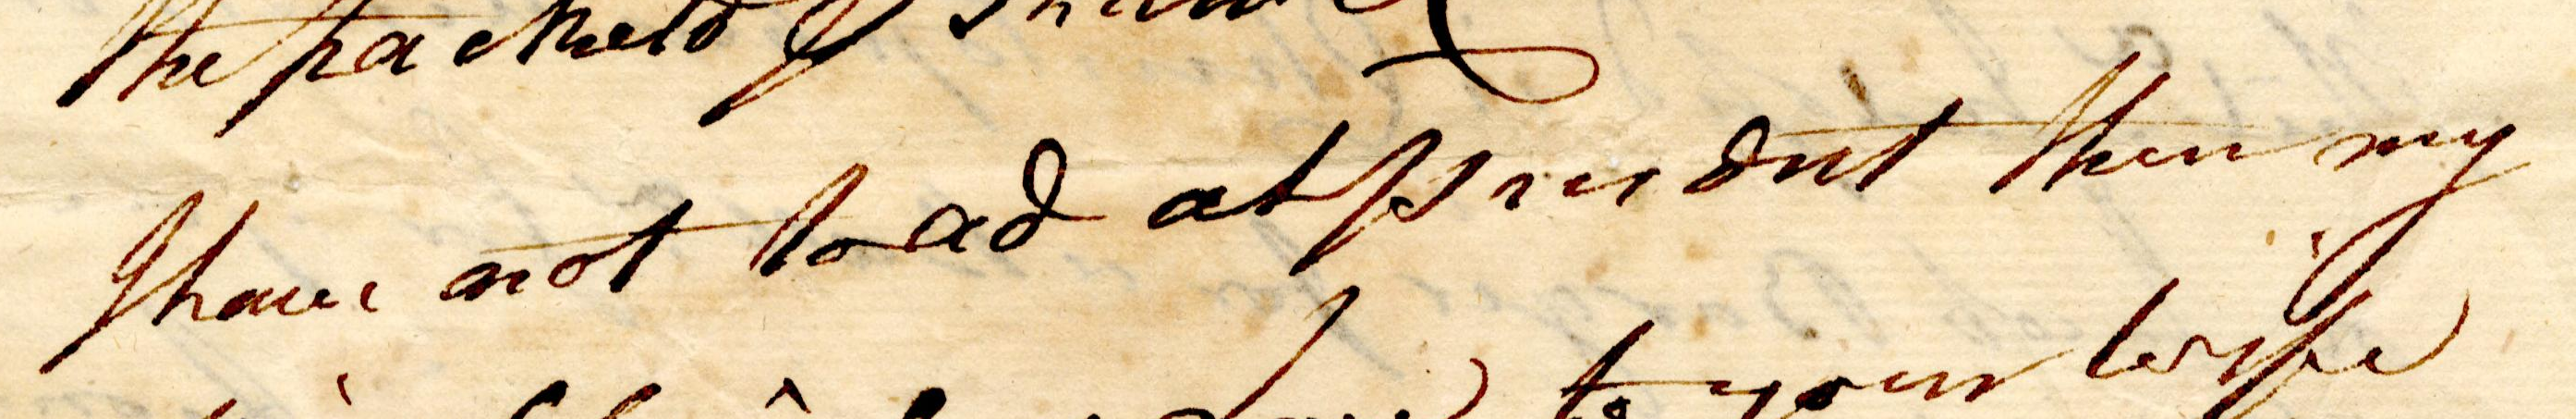I have not had at present them my
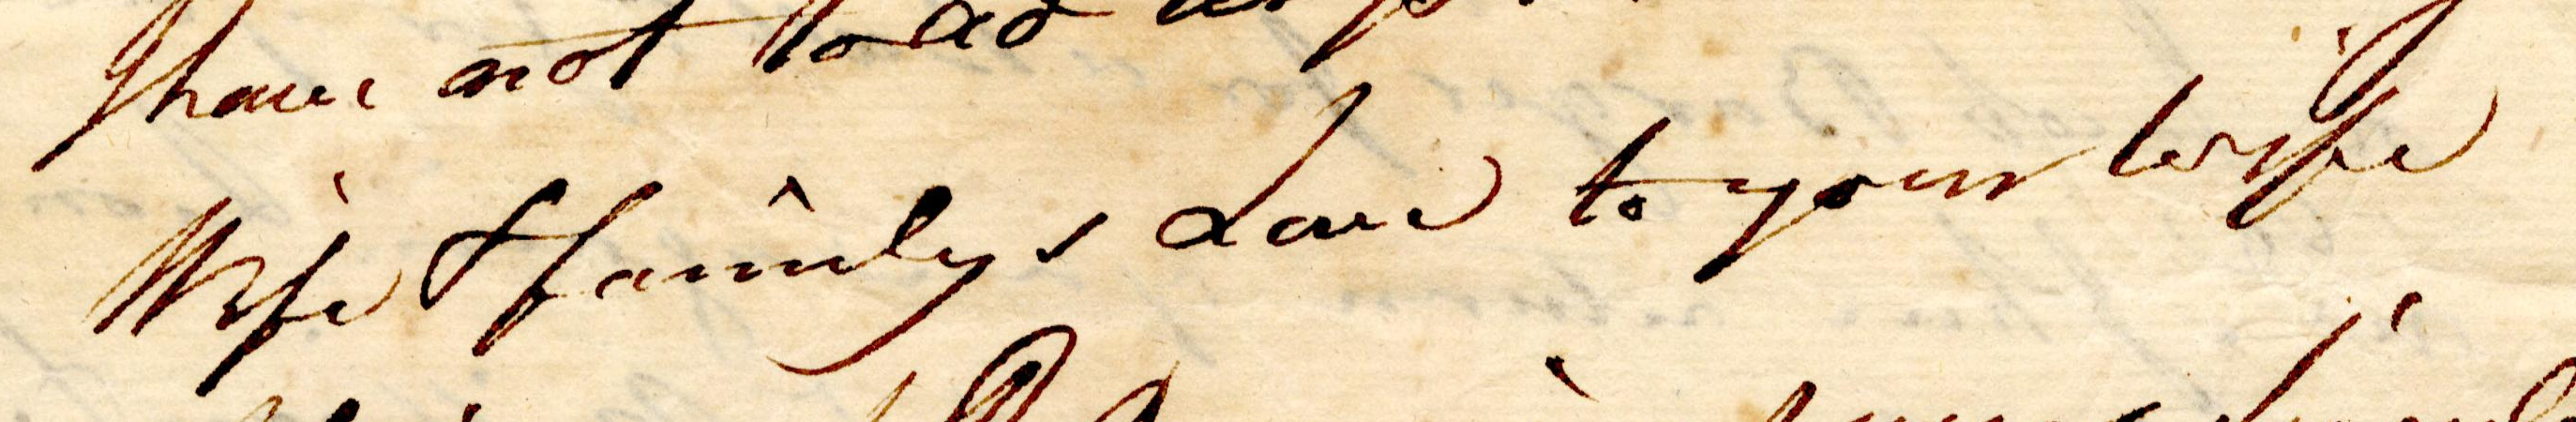wife & familys Love to your wife
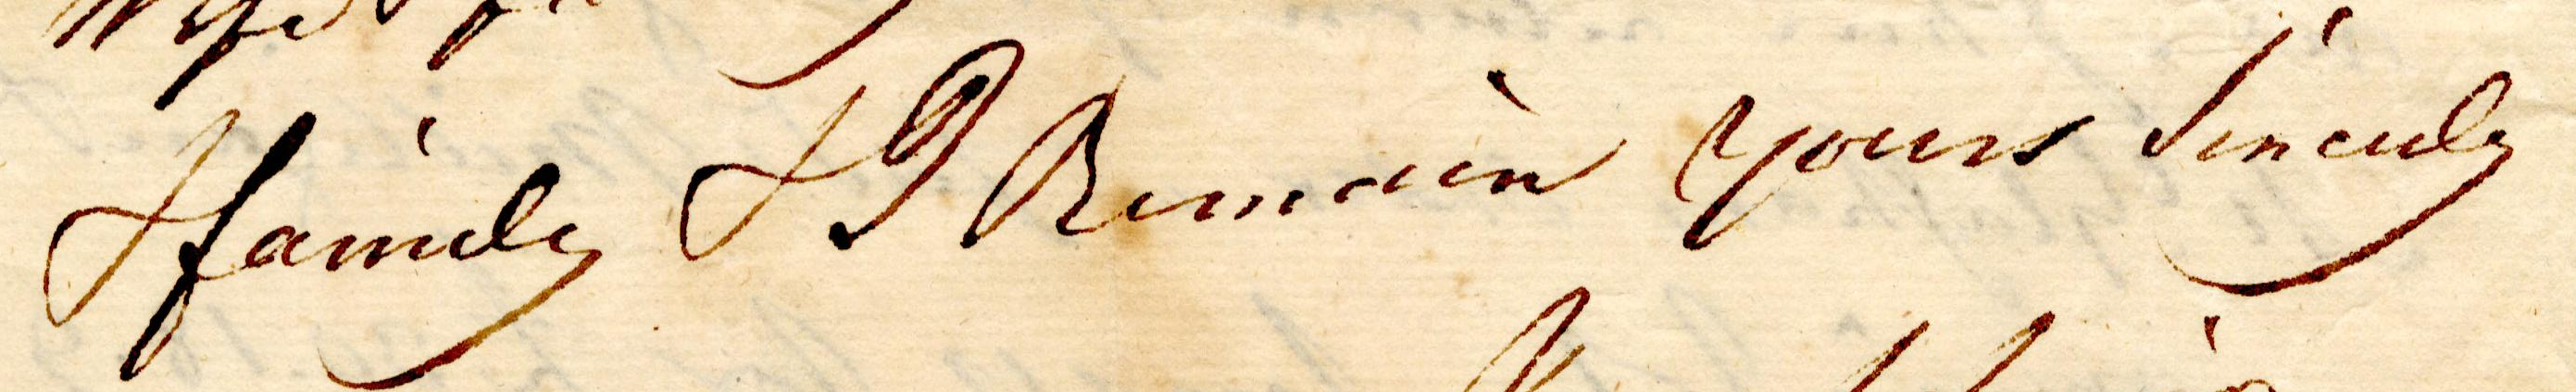& family & I Remain yours Sincerly
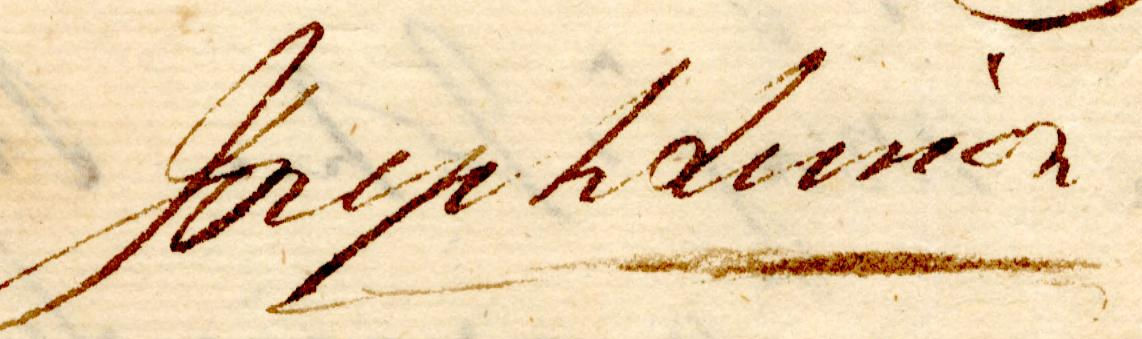Joseph Simon
